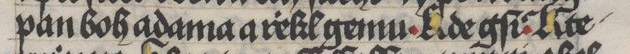pan boh adama a ṙekl gemu.Kde gſi?Kte¬
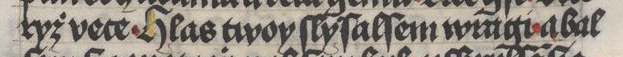ryż vece.Hlas twoy ſlyẛalſem wragi.a bal
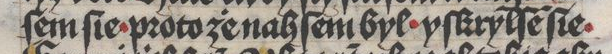ſem ſie.proto że nahſem byl.y ſkrylſē ſie.
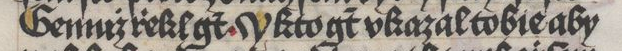Gemuż ṙekl ḡt.Y kto ḡt vkazal tobie aby
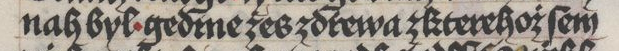nah byl.gedine żes zdṙewa zkterehoż ſem
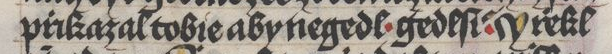pṙikazal tobie aby negedl.gedlſi?Y ṙekl
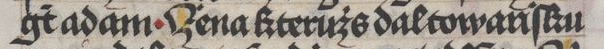ḡt adam.Żena kterużs dal towariẛku
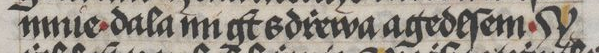mnie.dala mi ḡt s dṙewa a gedlſem.Y
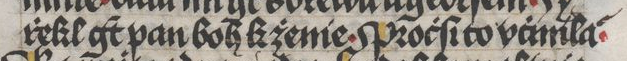ṙekl ḡt pan boh k żeníe.Proċſi to vċinila?
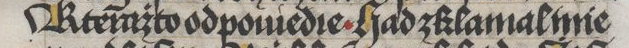Kterażto odpouiedie.Had zklamal mie
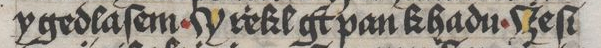y gedlaſem.Y ṙekl ḡt pan k hadu.Że ſi
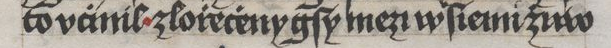to vċíníl.zloṙeċeny gſy mezi wẛiemi żiwo¬
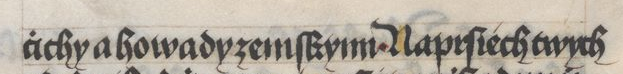ċichy a howady zemſkymi.Naprſiech twych
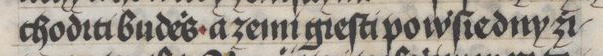choditi budeṡ.a zemí gieſtí powẛiedny żi¬
